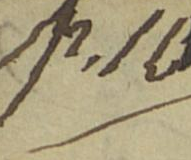p. 10
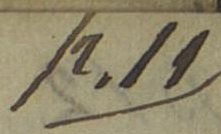p.11
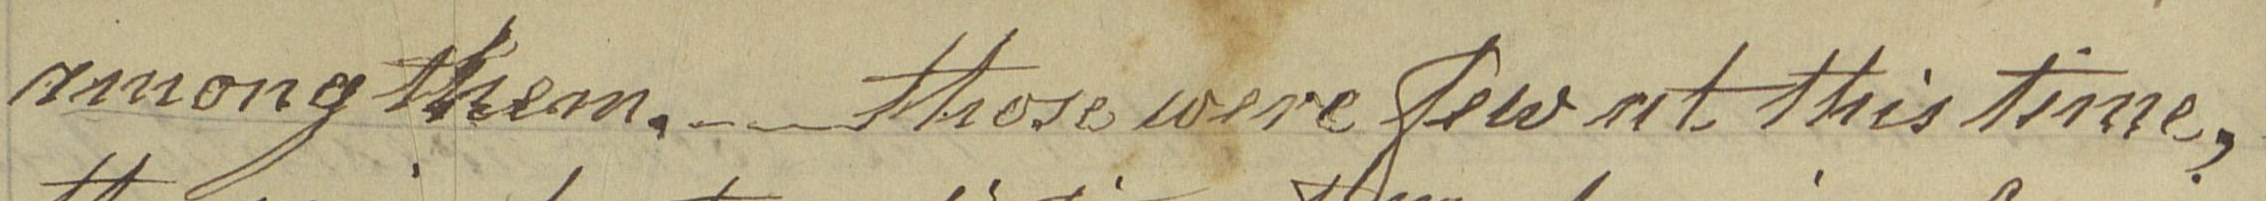among them.- those were few at this time,
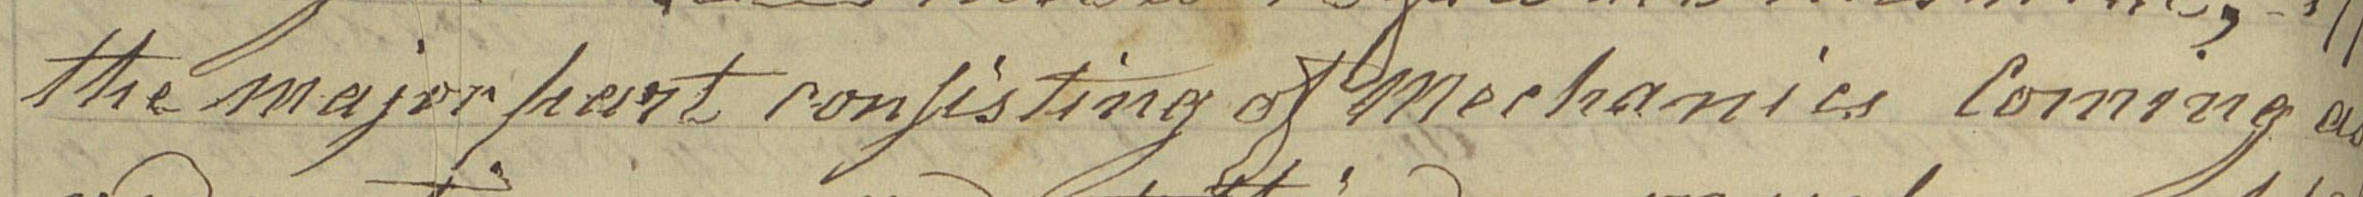the major part consisting of Mechanics Coming as
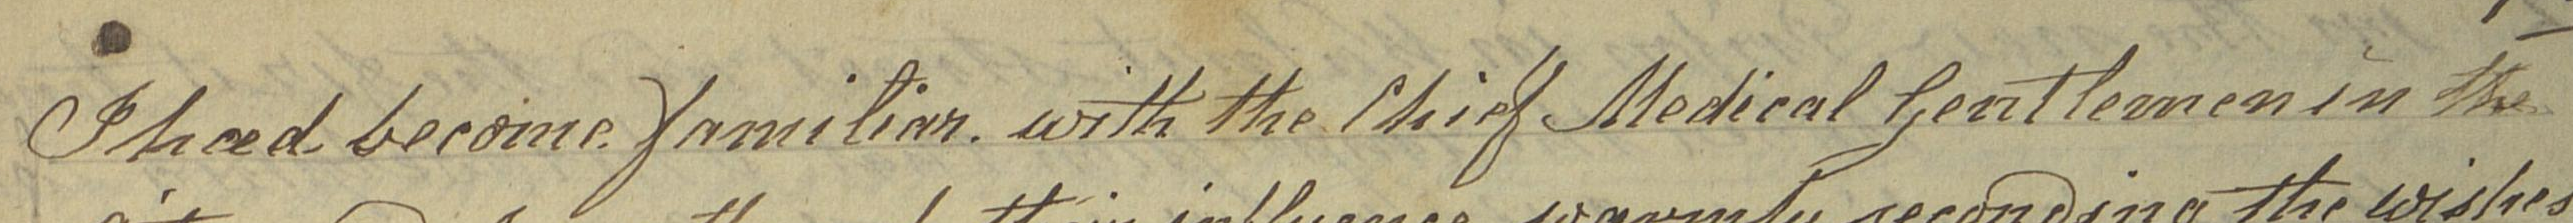I had become familiar with the Chief Medical Gentlemen in the
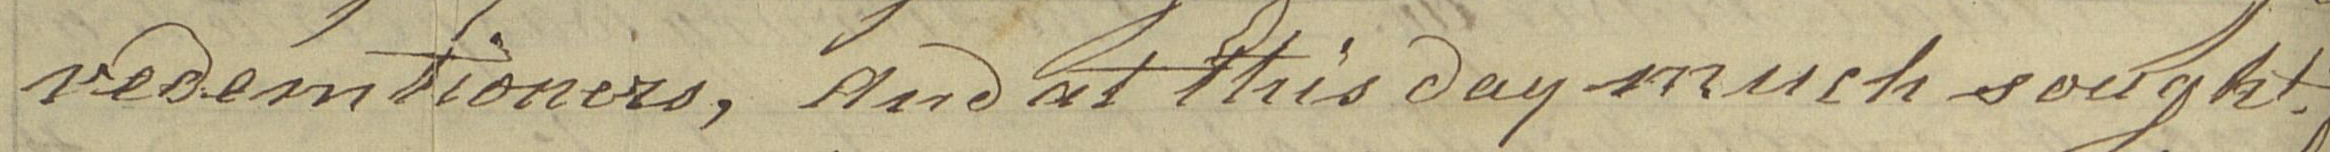redemtioners, and at this day much sought.
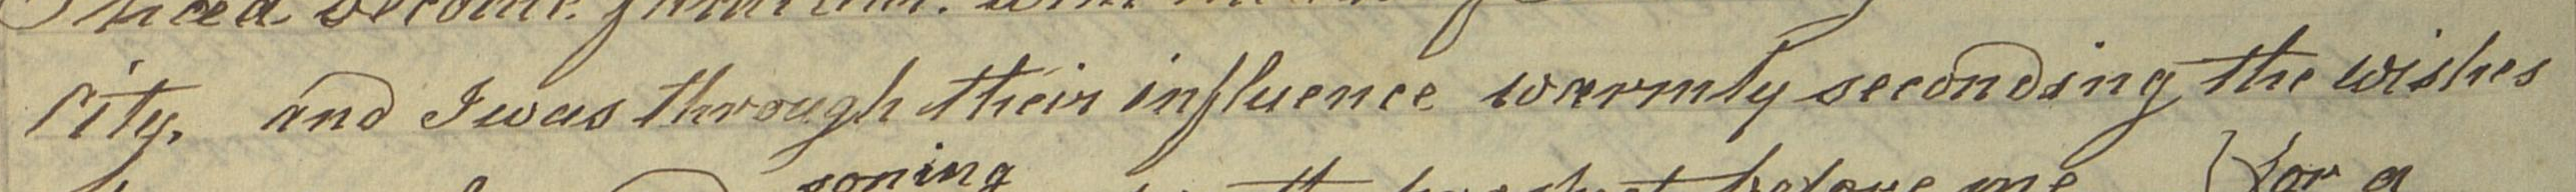City, and I was through their influence warmly seconding the wishes
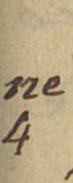-ne
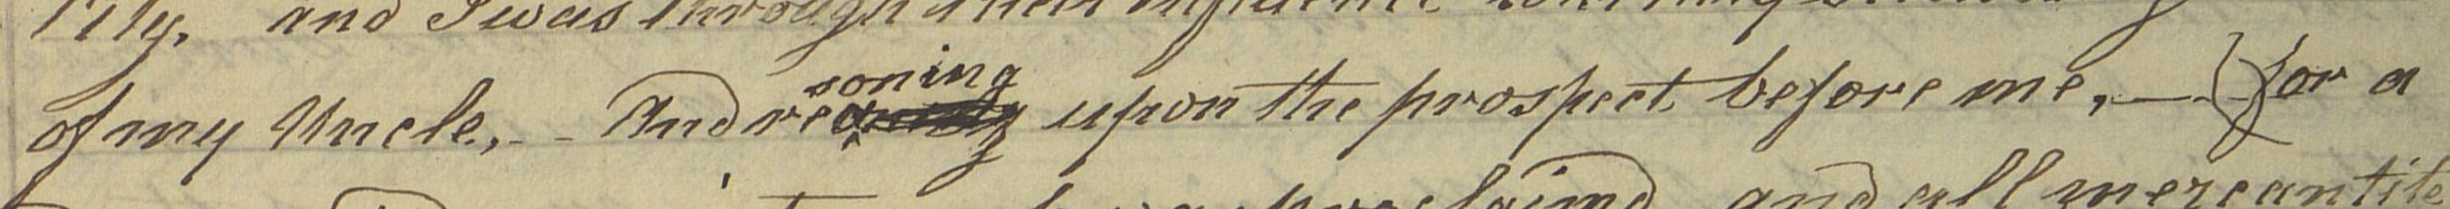of my Uncle.- And reasoning upon the prospect before me, (for a
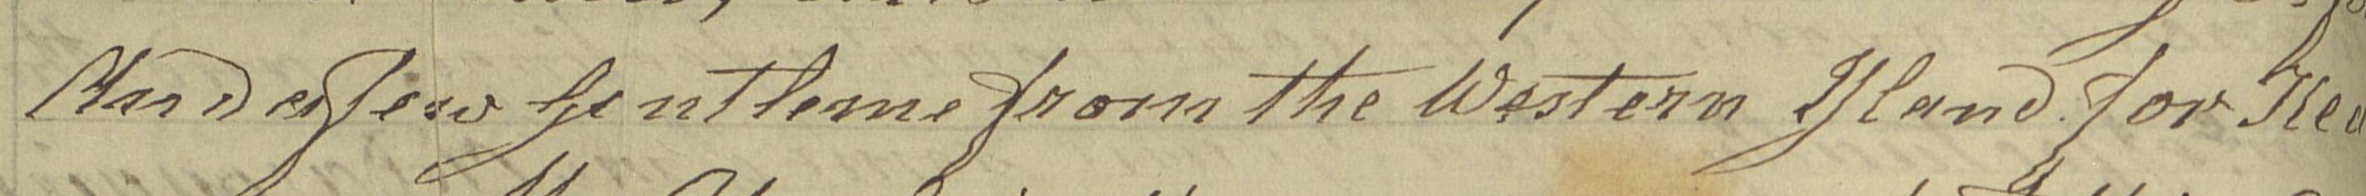And a few Gentleme from the Western Island for Kea-
